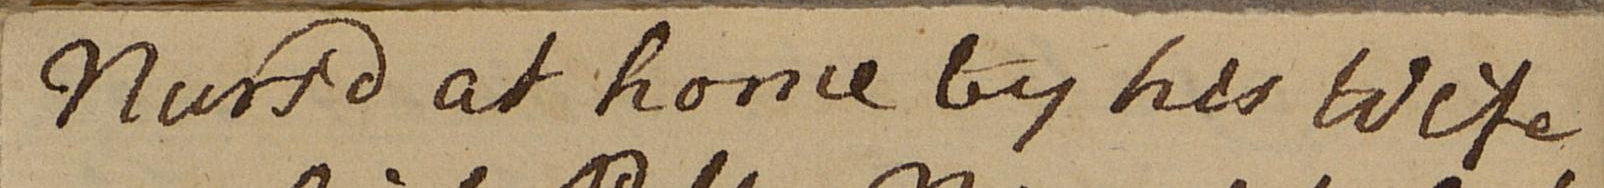Nurs'd at home by his Wife,
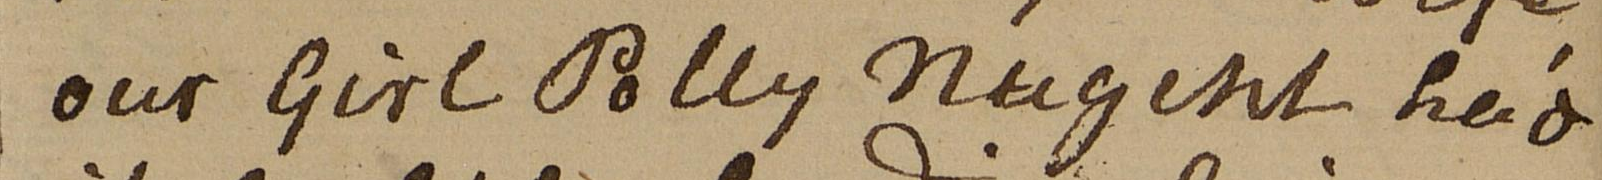our Girl Polly Nugent has
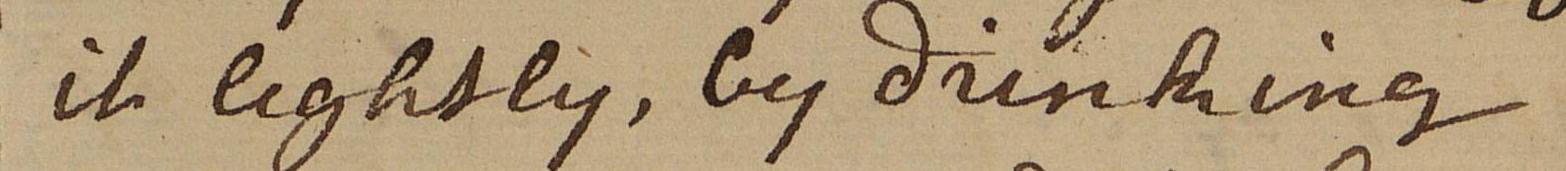it lightly, by drinking
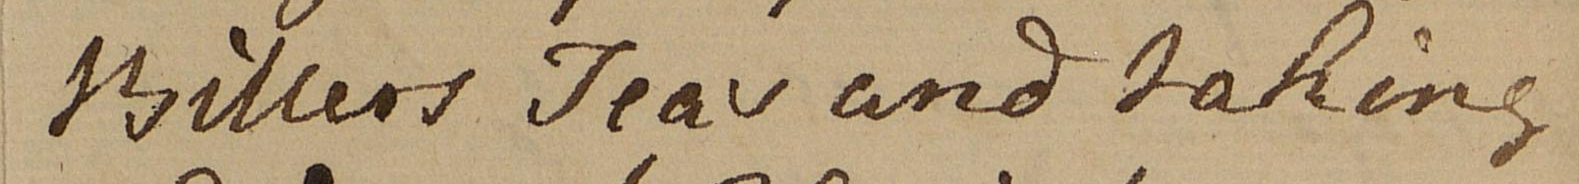Bitters Teas and taking
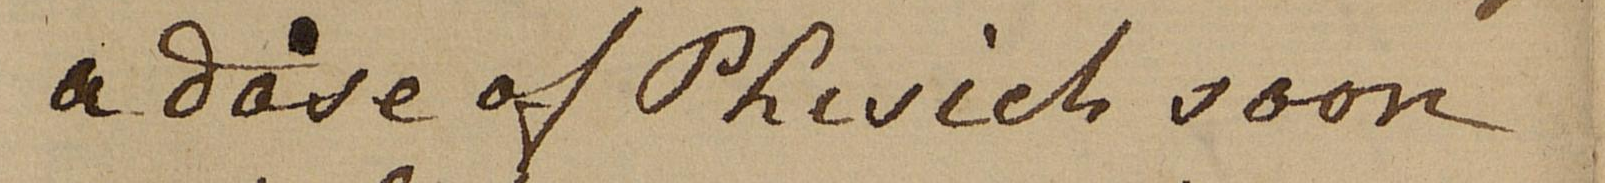a dose of Phisick soon
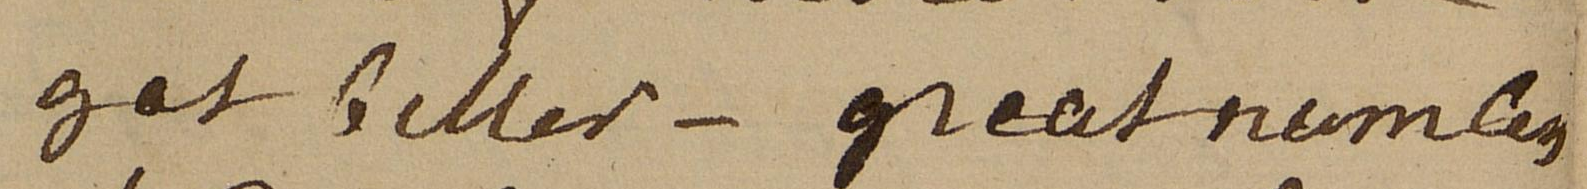got better- great number
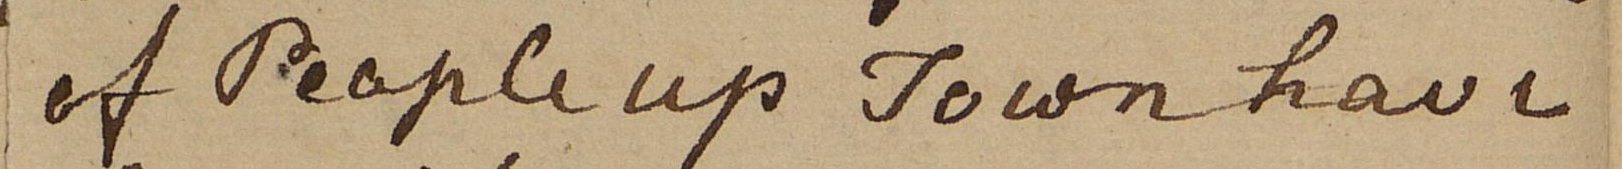of People up Town have
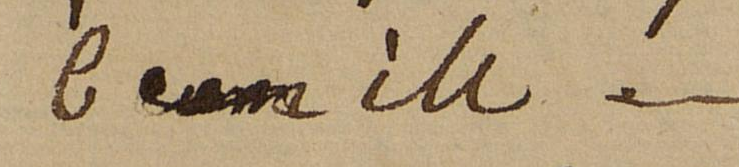been ill-
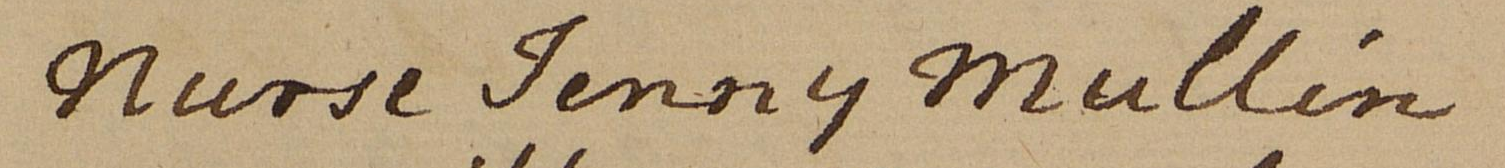Nurse Jenny Mullin
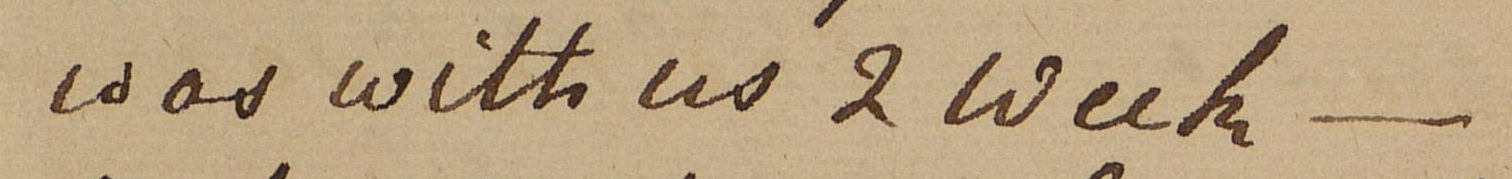was with us 2 Week-
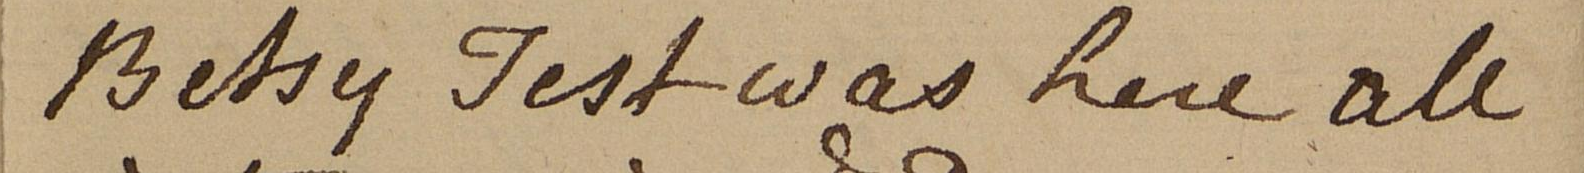Betsy Test was here all
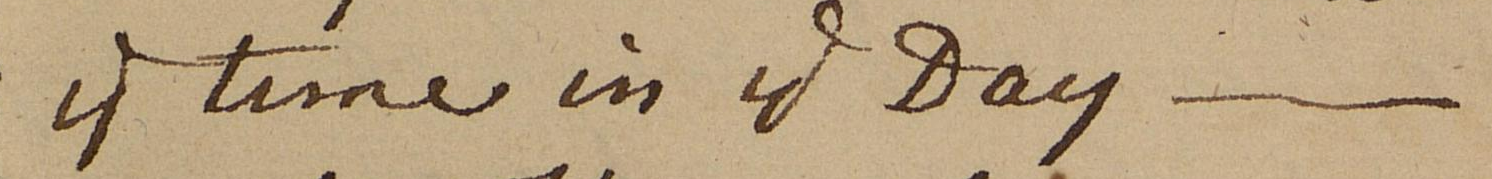y^e time in y^e Day-
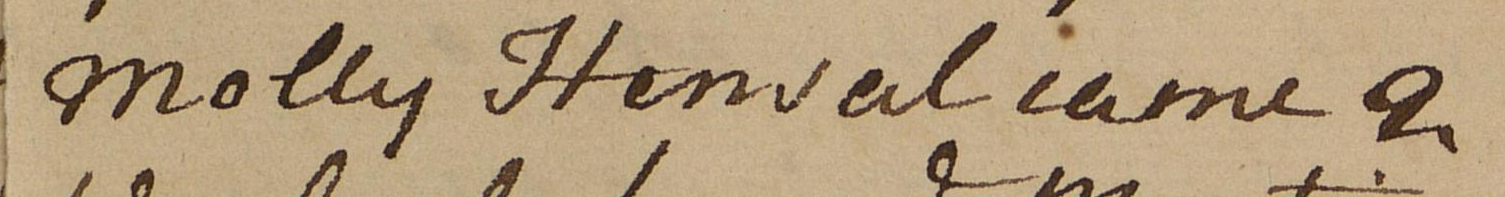Molly Hensal came 2
